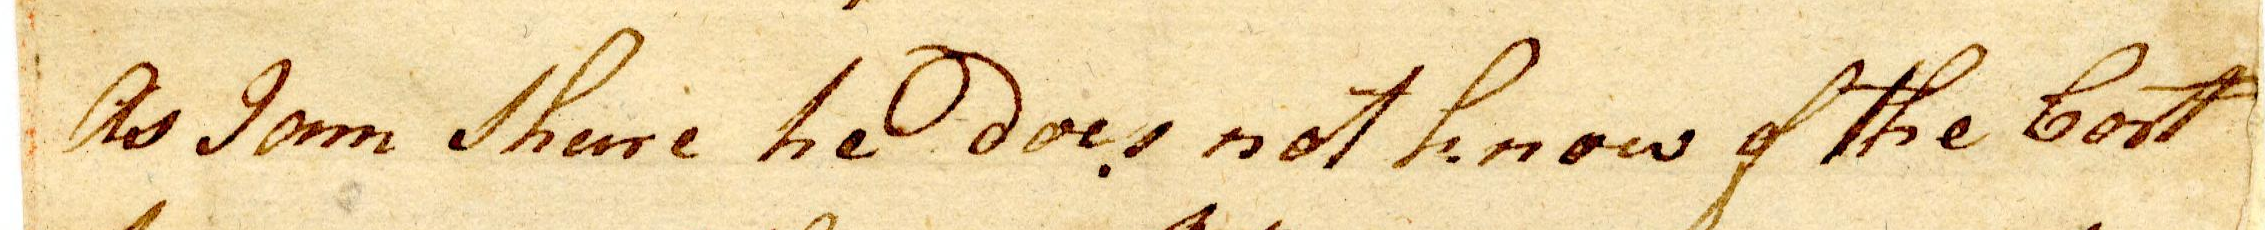As I am Shure he does not know of the Cort
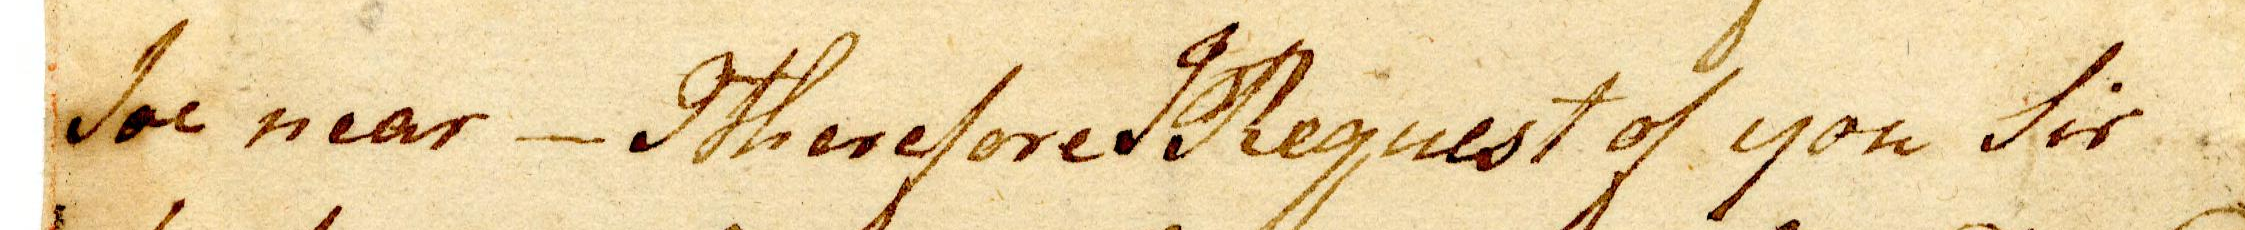Joe near- I therefore I Request of you Sir
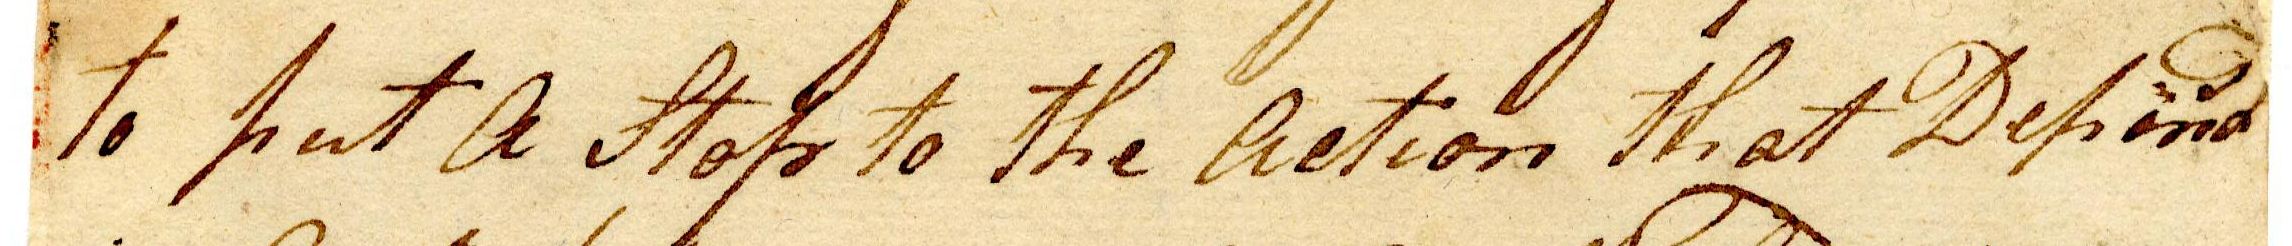to put a Stop to the Action that Depend,
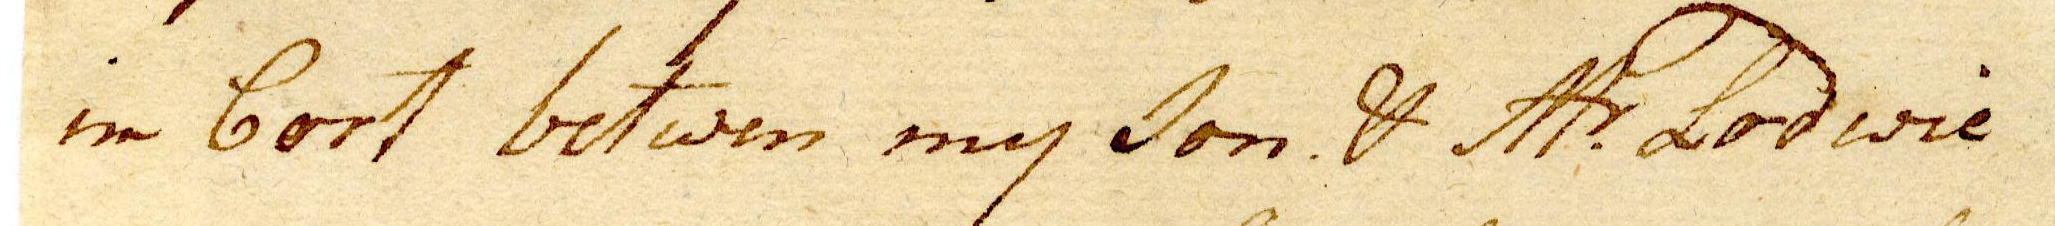in Cort betwen my Son & M^r. Lodwie
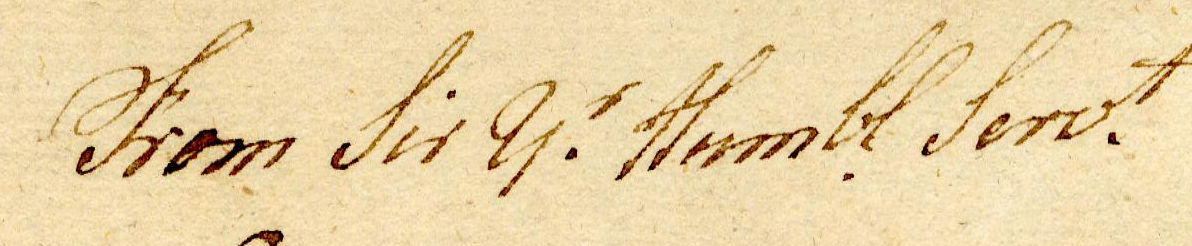From Sir Y^r. Humbl Serv^t.
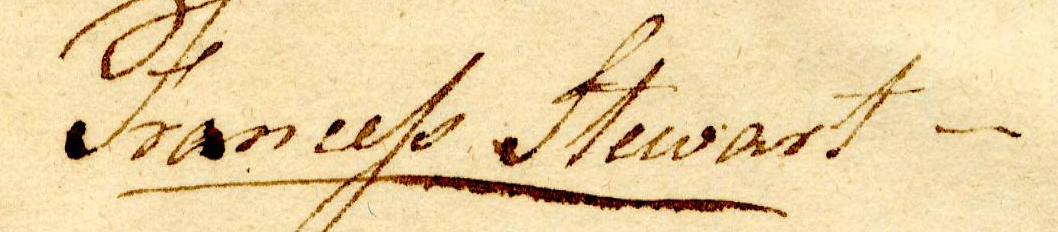Francess Stewart
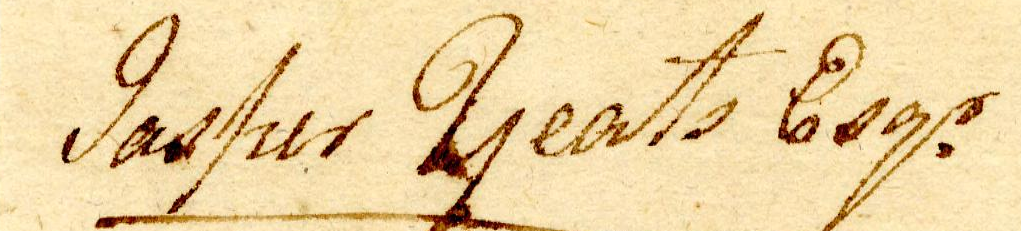Jasper Yeats Esq^r.
